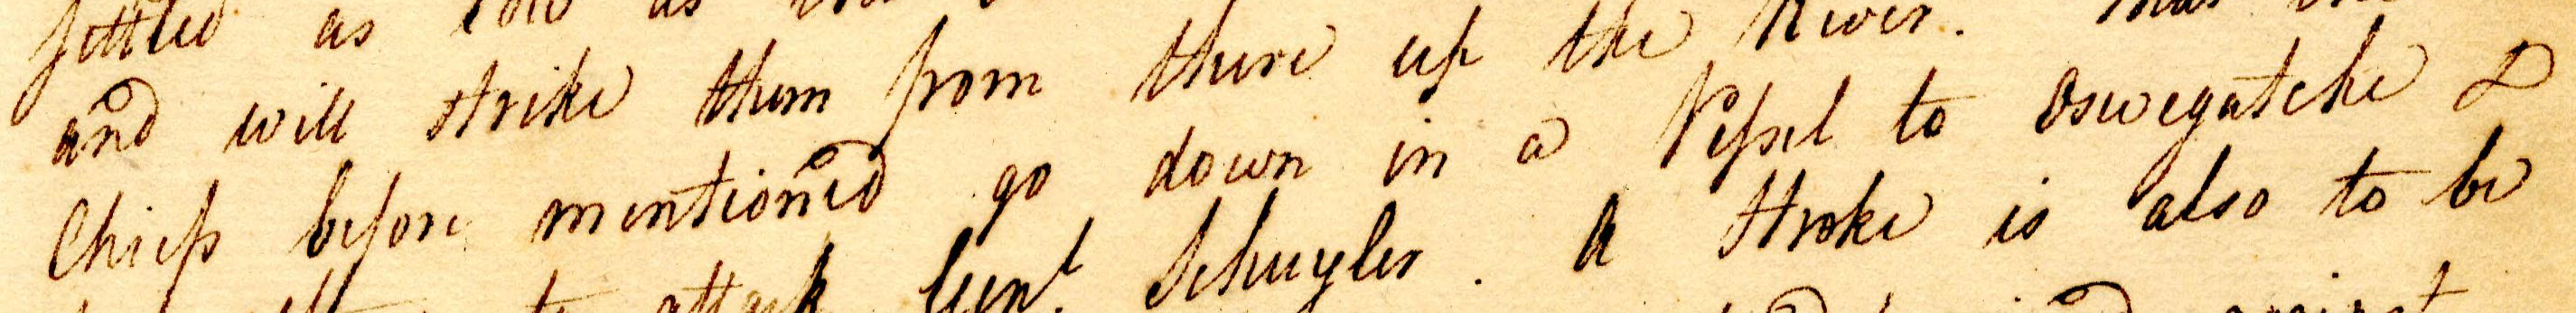Chiefs before mentioned go down in a Vessel to Oswegatche &
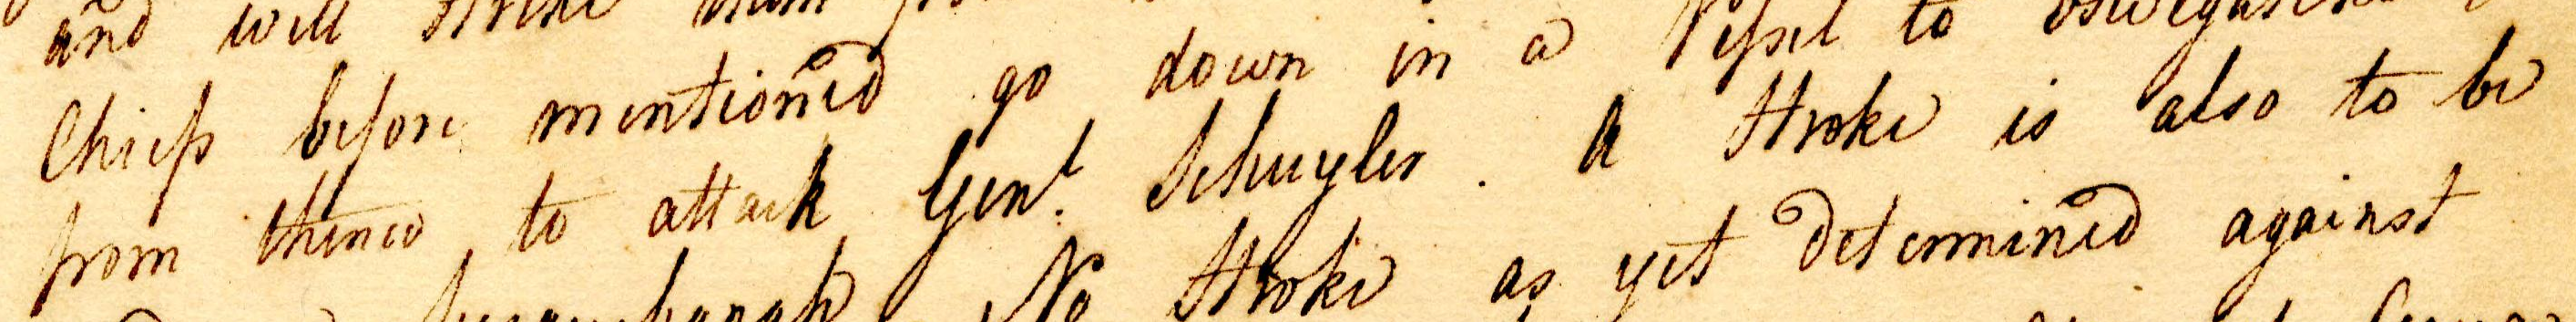from thence to attack Gen^l. Schuyler. A stroke is also to be
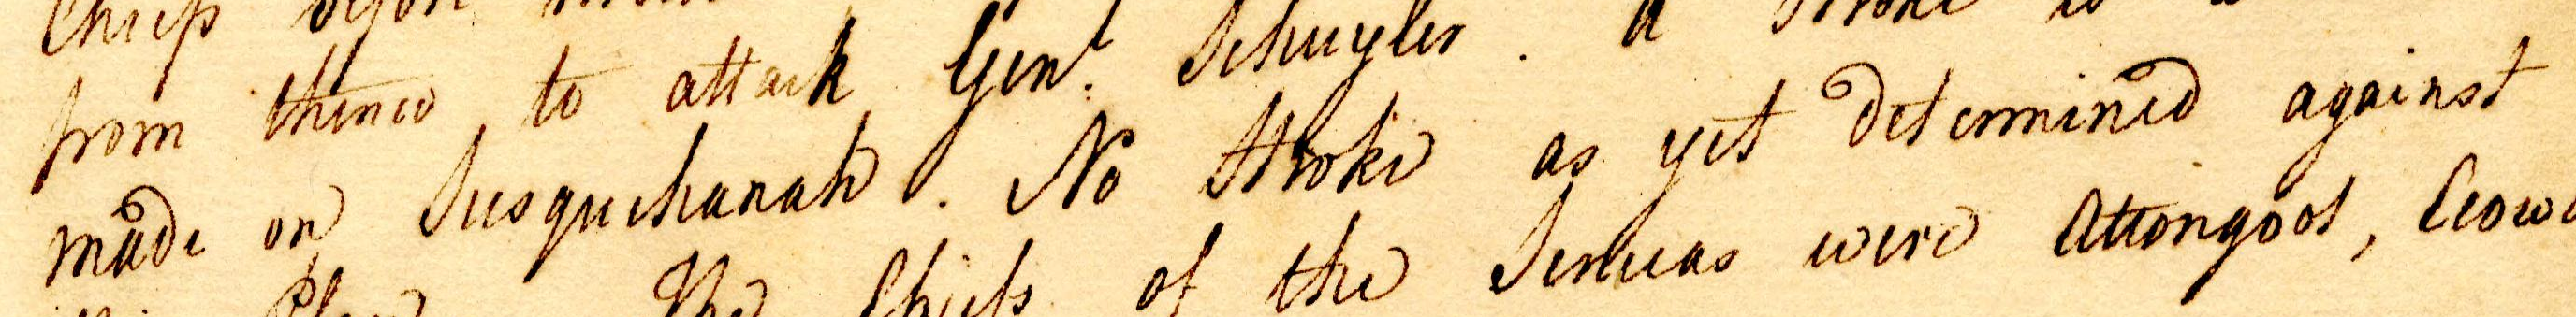made on Susquehanah. No stroke as yet determined against
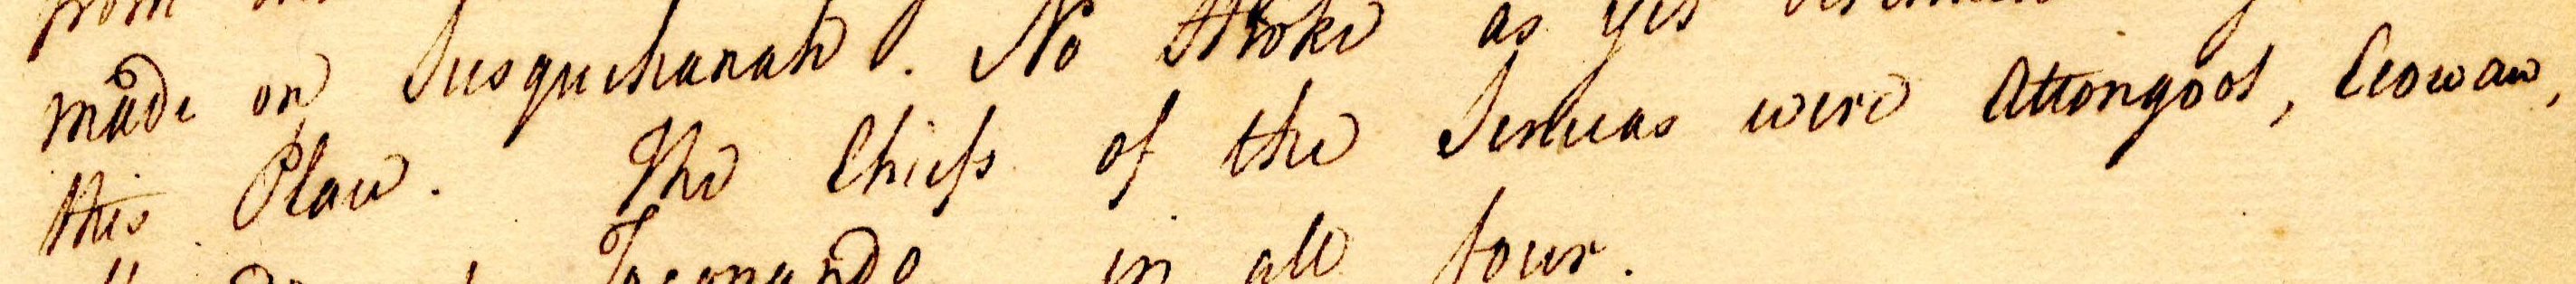this Place. The Chiefs of the Senecas were Attongoos, Ceowan,
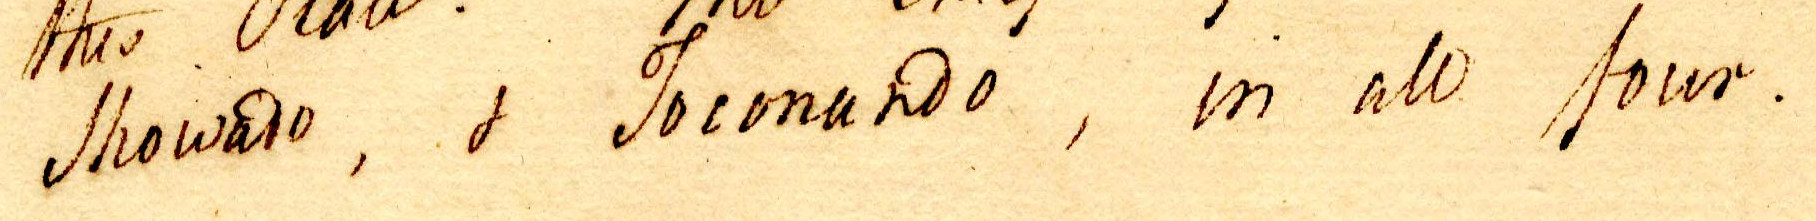Showado, & Toconando, in all four.
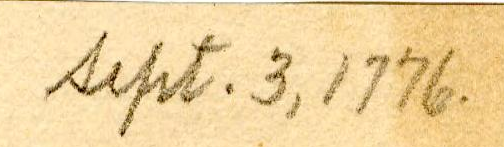Sept. 3, 1776.
